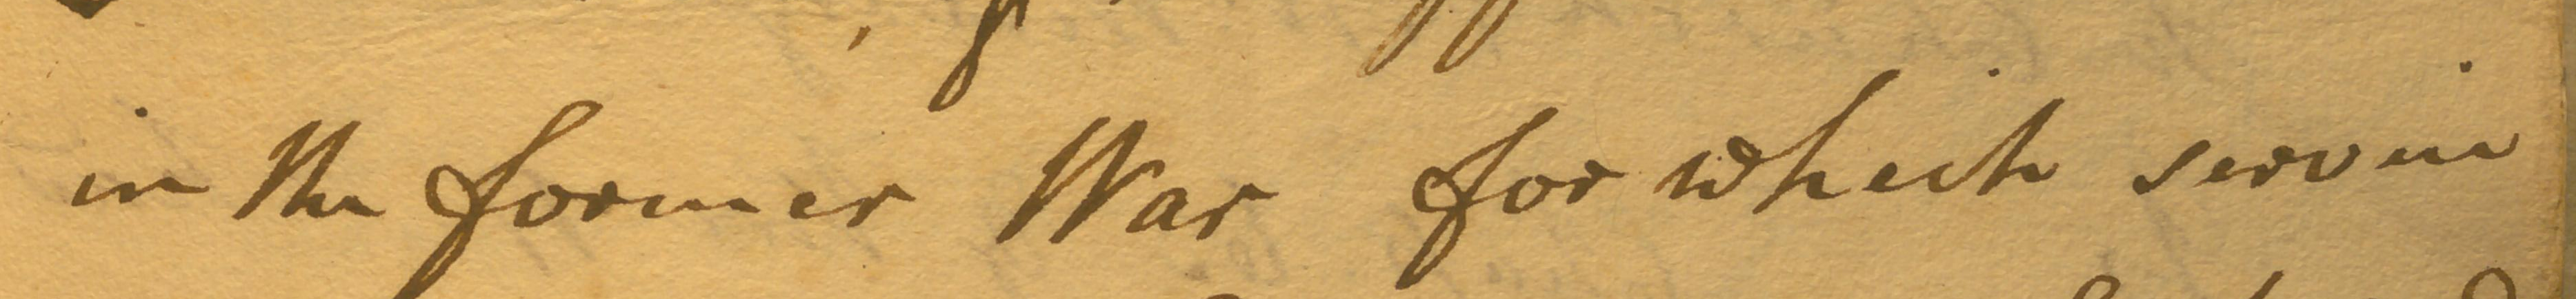in the former War for which service
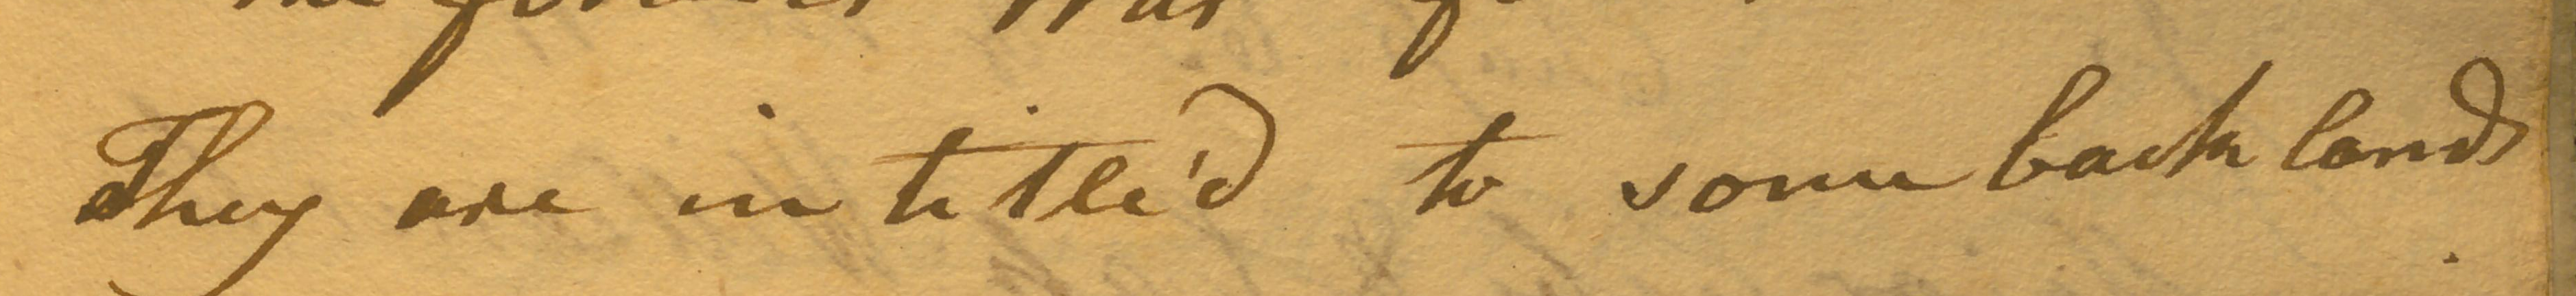They are intitle'd to some back land
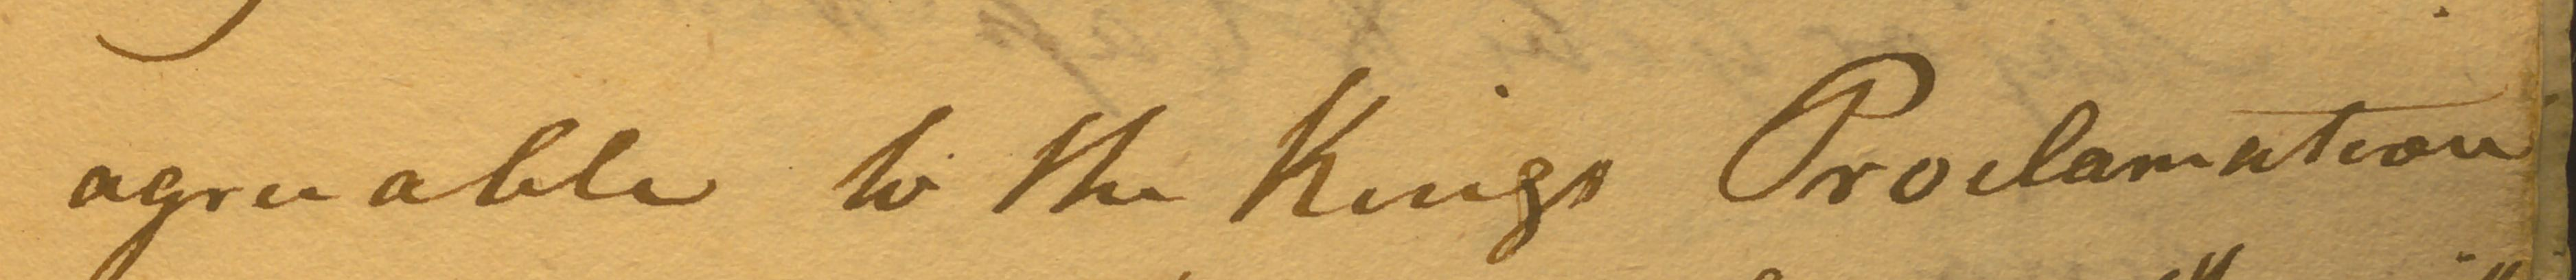agreeable to the Kings Proclamation
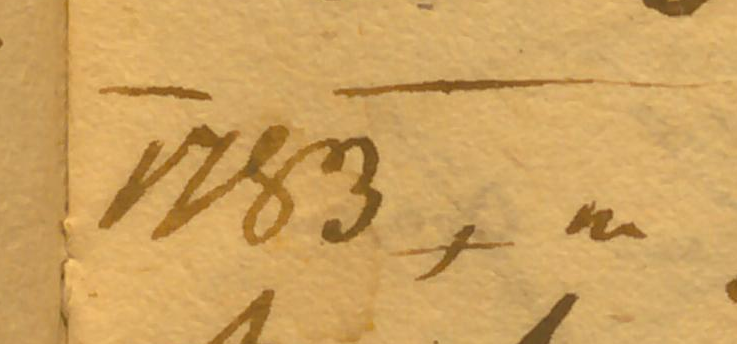1783
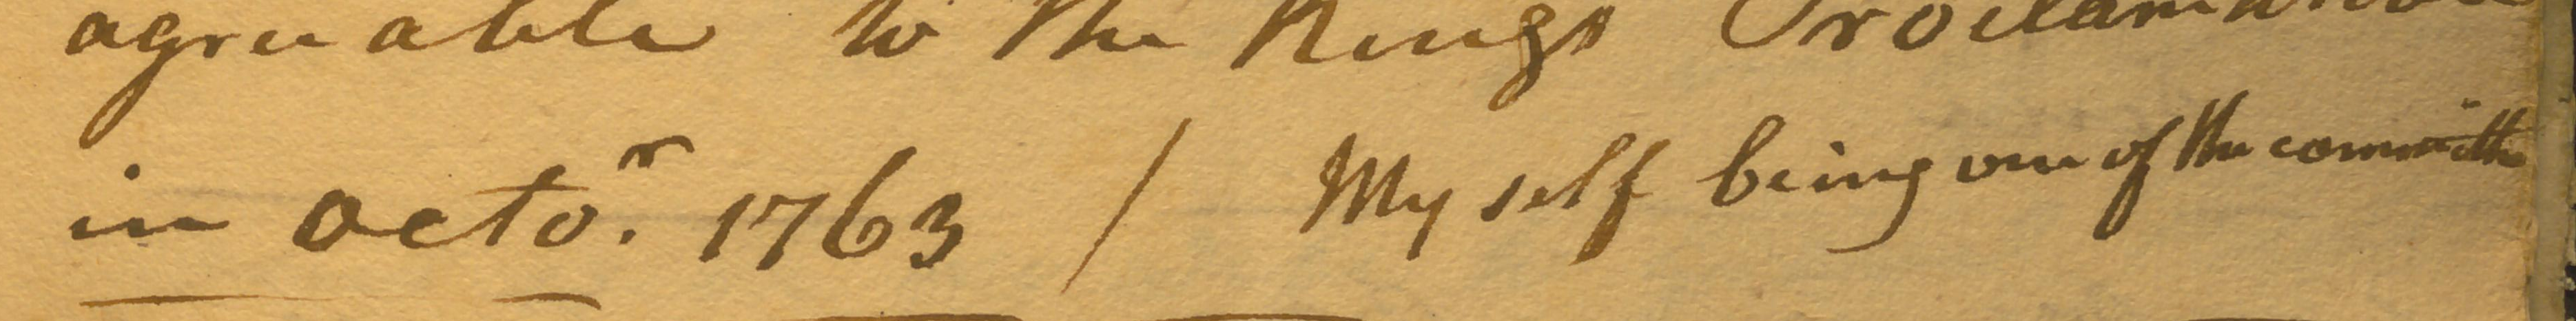in octo^r. 1763/ My self being onee of the committee
